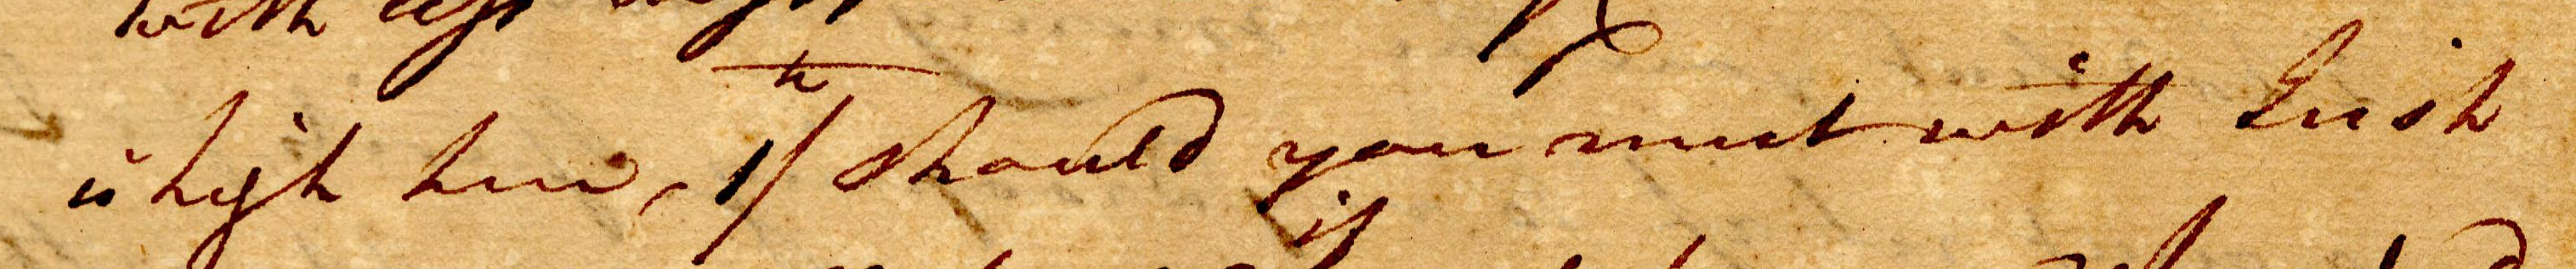which here if should your meet with lish
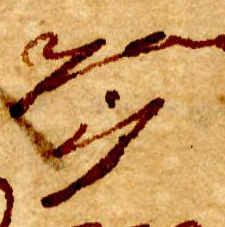if
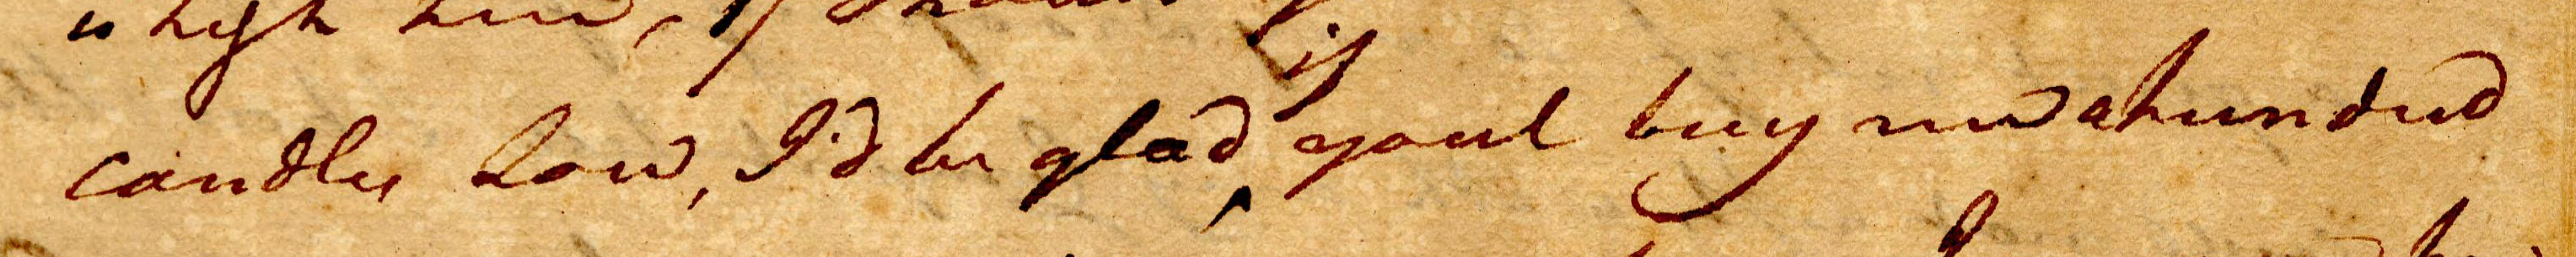candles Low, I'd be glad youl buy me a hundred
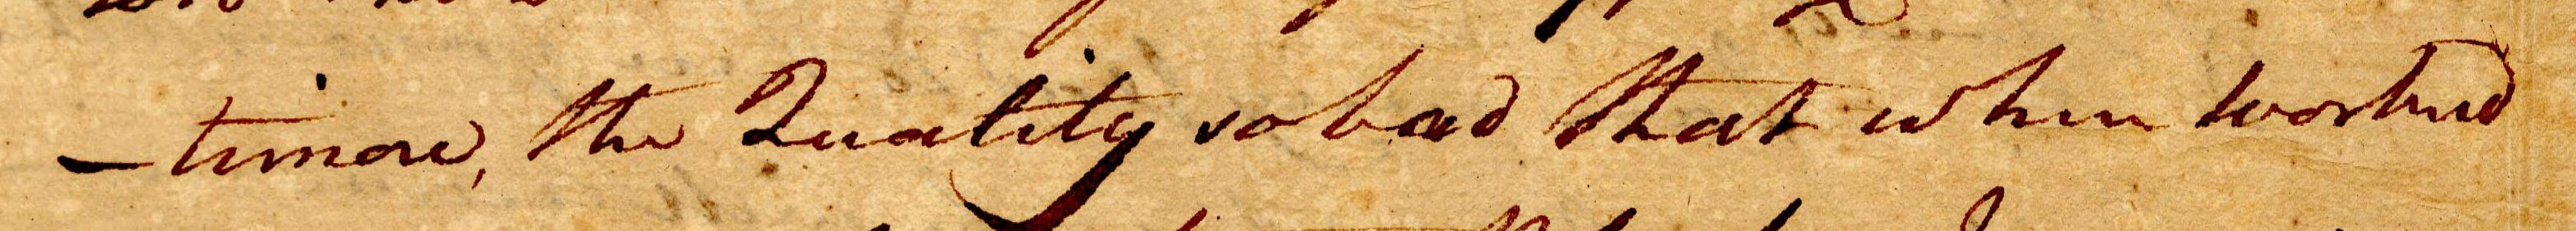-timore, the Quality so bad that when worked
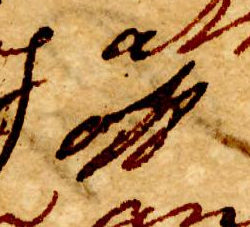off
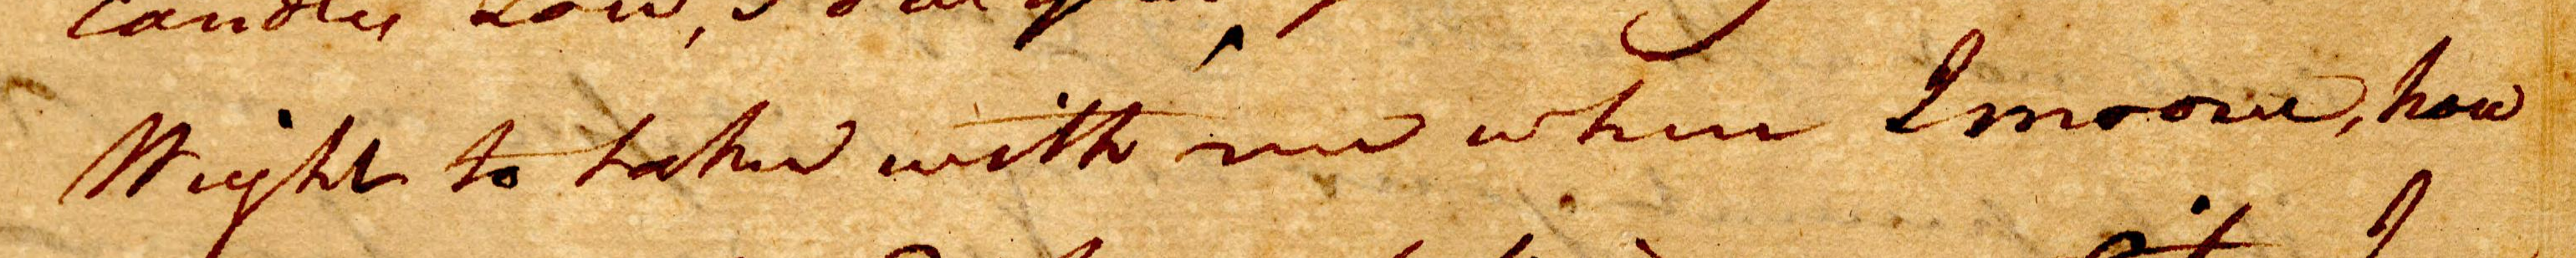might to take with me when I moove, how
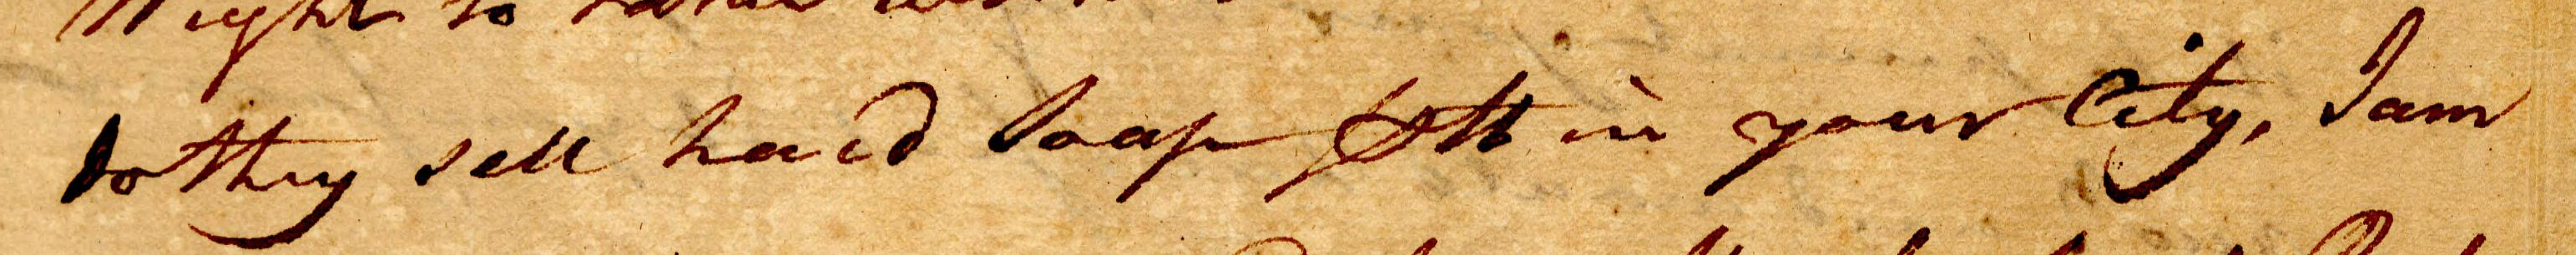so they sell havd soap per lb in your City, I am
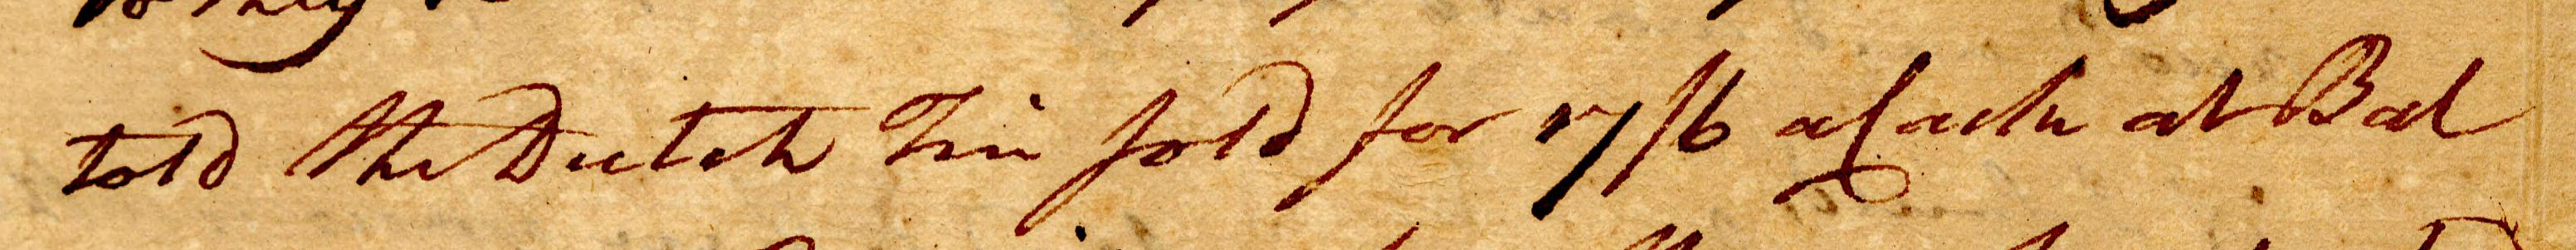told the Dutch Tin sold for 17s6 a Cash at Bal-
